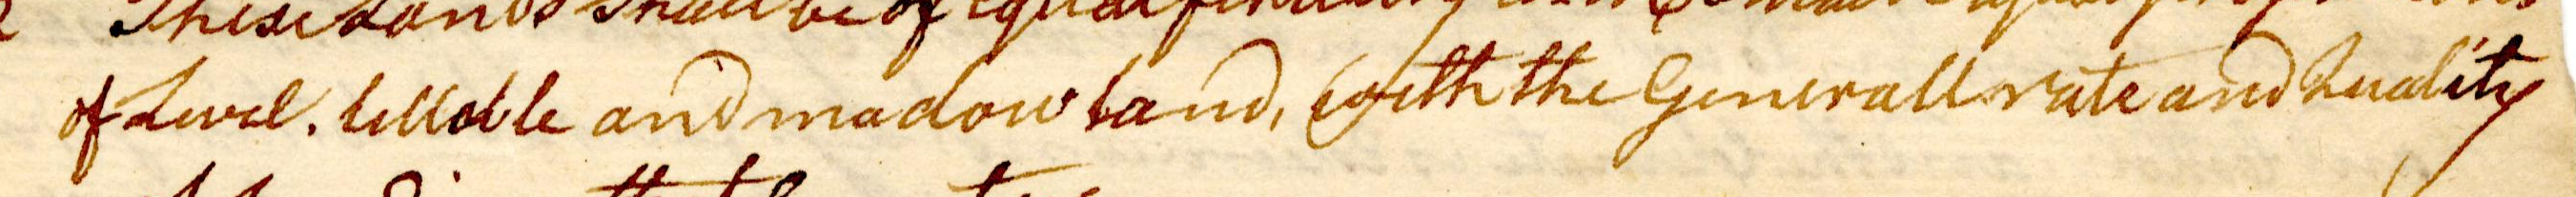of Level, tillable and madow land, with the Generall rate and quality
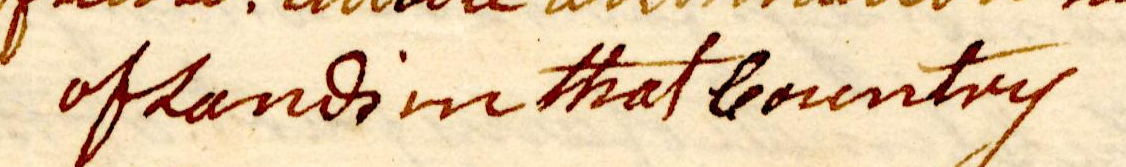of Lands in that Country
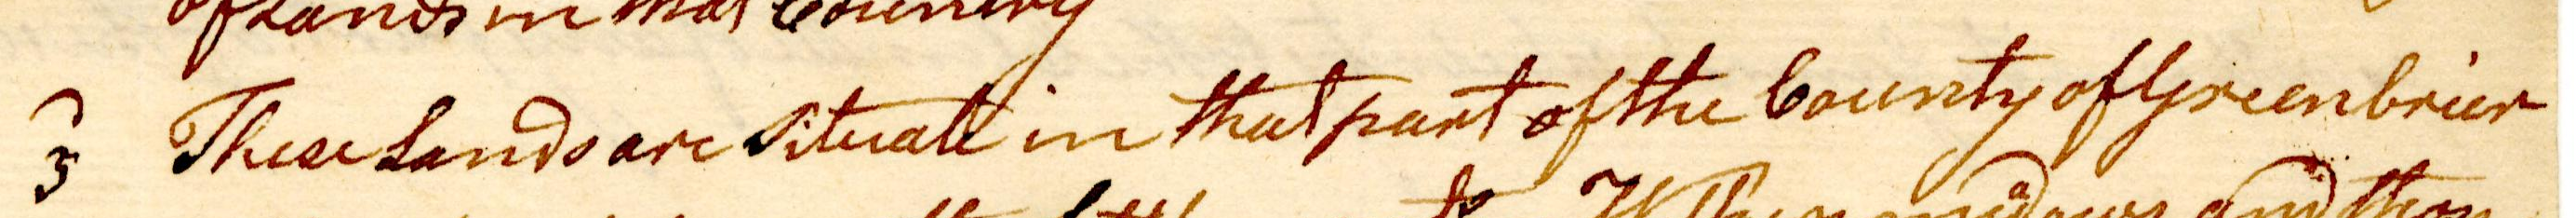3^d These lands are situate in that part of the County of Greenbrier
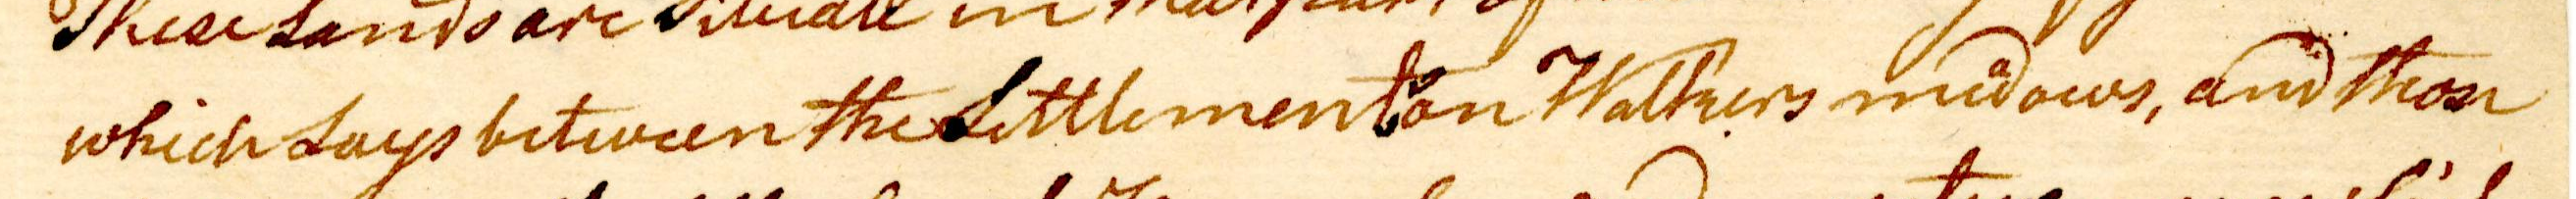which lays between the settlement an Walkers me^adows, and those
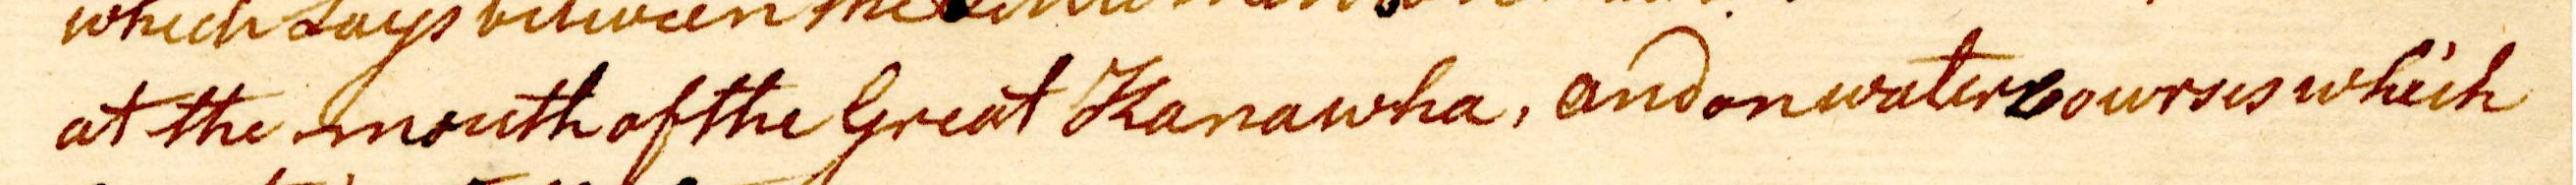at the mouth of the Great Kanawha, and on water courses which
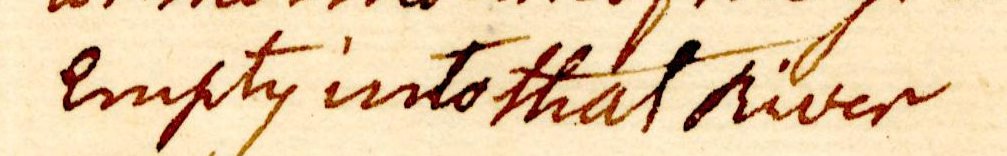Empty into that River
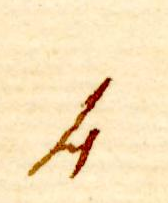4
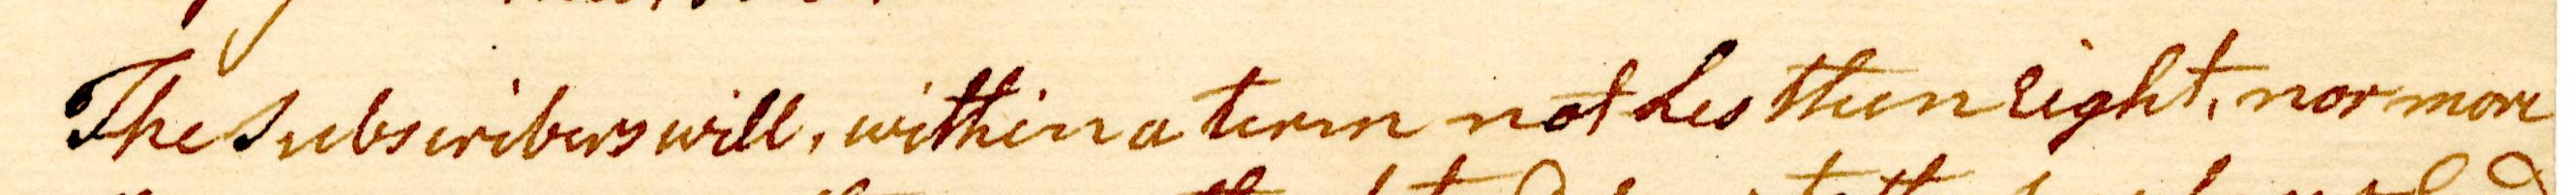The subscribers will, within a term not Les then Eight, nor more
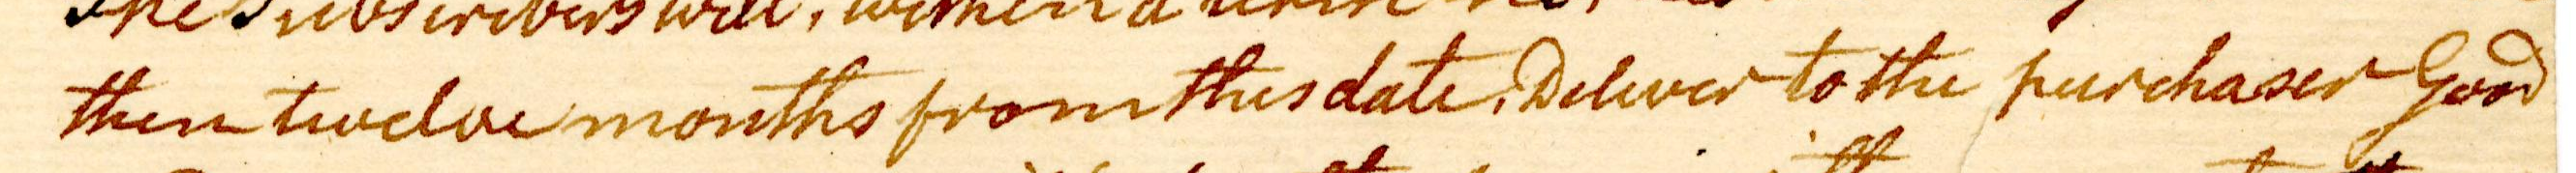there twelve months from this date deliver to the purchaser Good
